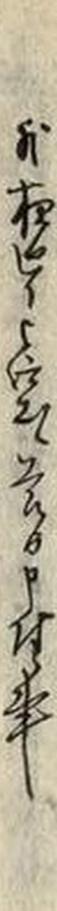外夜廻り被仰出候節ゟ申付候事
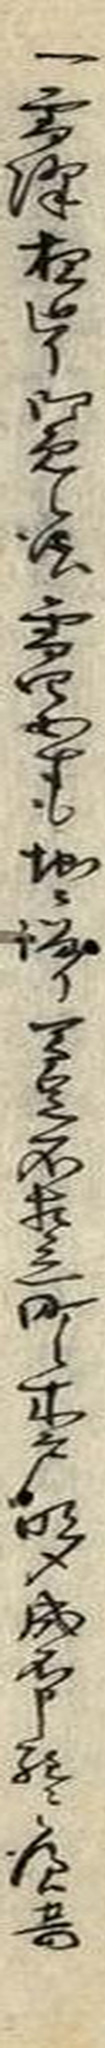一雪降夜廻り御免之儀は雪四五寸も地に溜り馬足不相立町之木戸明〆成不申程に候得は寄
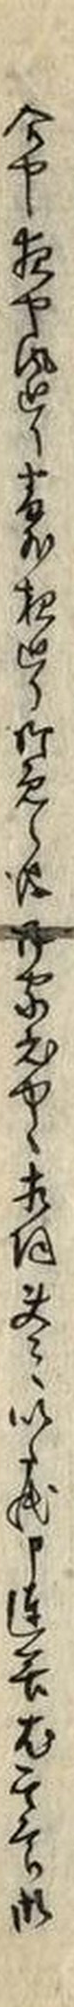合中夜中風廻り番外夜廻り御免之儀御家老中へ相伺夫々へ以手紙申達筈尤其節御
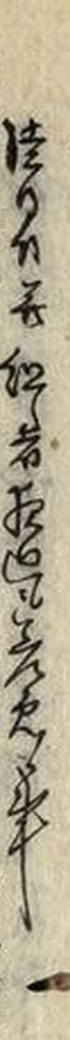徒目付并組之者夜廻も差免候事

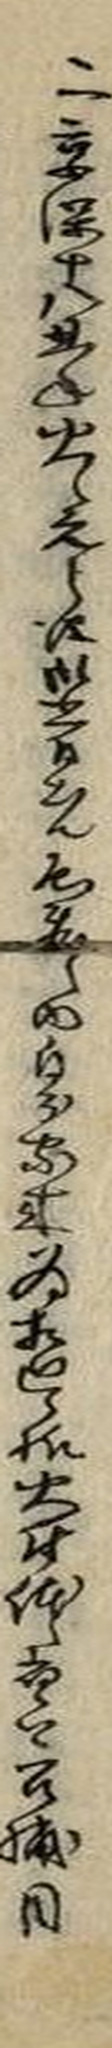一享保十八丑年火之元之儀御書付出ル屋敷之内自分家来為相廻候様火附体之者候はゝ召捕目
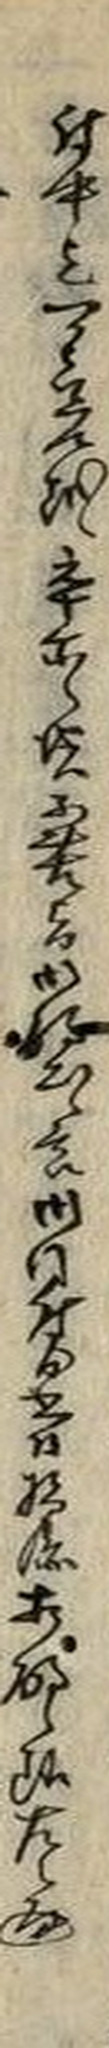付中迄可被差越候卒爾之儀は不苦旨御触出候節御目付ゟ書付指添相触候趣左之通
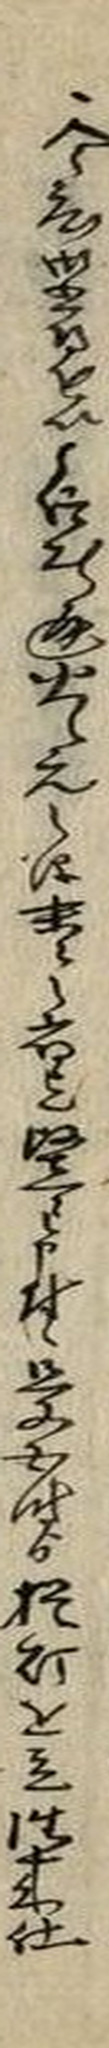・今度御書付を以被仰出候通火之元之儀末々之者迄堅可被申付候且又五時ゟ提灯を立往来仕
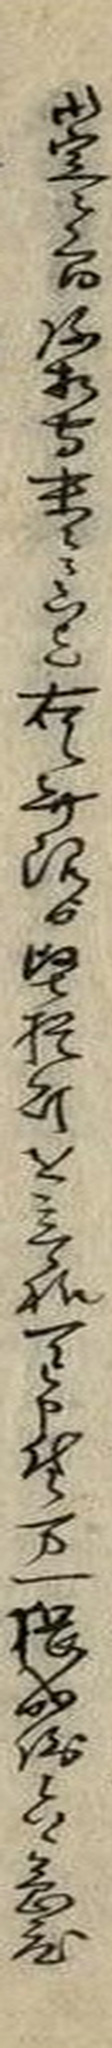御定に候間弥相守末々に至迄右之刻限ゟ堅提灯を立候様可被申付候万一猥成儀候はゝ急度
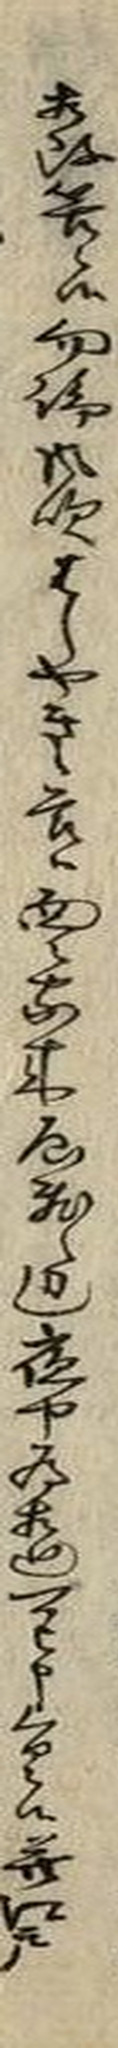相改筈に候勿論風吹はしやき候節は面々家来屋敷之辺夜中為相廻可被申旨に候并江戸
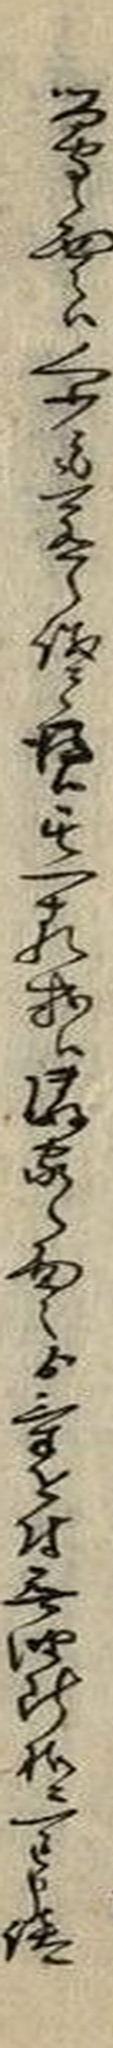留守之面々は人少にも可有之儀に候得は其一類或は隣家之面々ゟ気を付無油断様に可被申談候
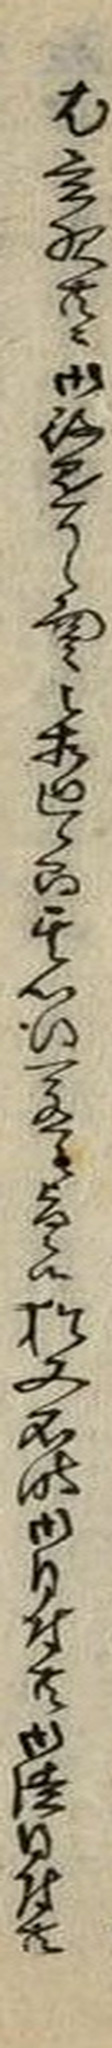尤昼夜共に御役懸り之面々被相廻候間其心得可有之旨に候猶又不時御目付共御徒目付共
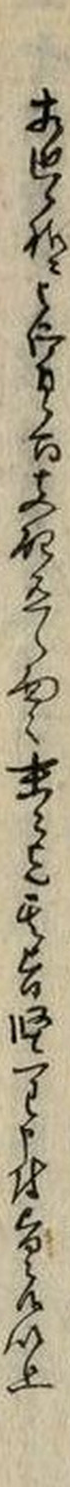相廻候様に被仰付候間支配有之面々末々迄其旨堅可被申付旨に候以上
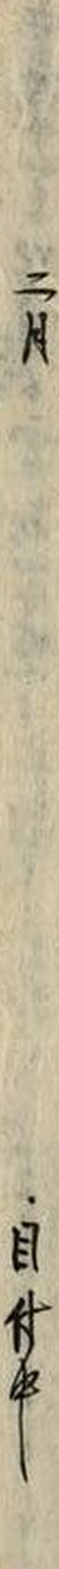二月目付中
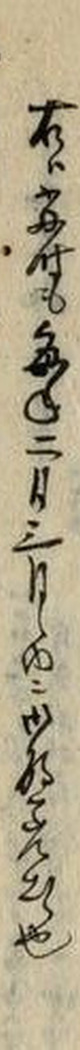右は当時も毎年二月三月之内に御触差出候也
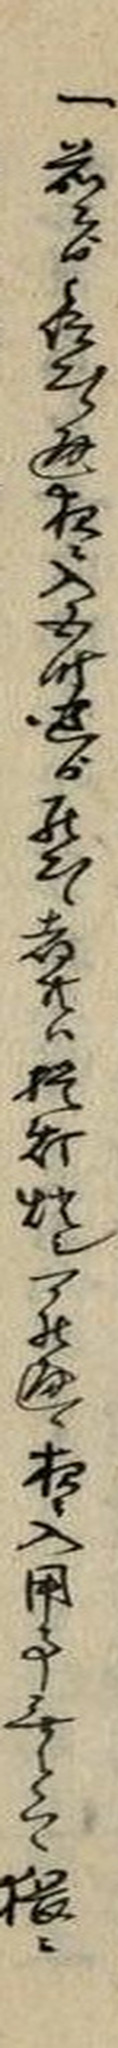一前々ゟ被仰出候通夜に入五時過ゟ罷出候者共は提灯灯シ可罷通候夜に入用事無之候はゝ猥に
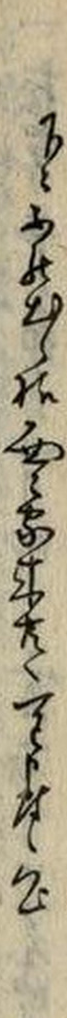下々不罷出候様面々家来共へ可被申付候以上
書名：御城下諸事之部
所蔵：福井県文書館 Fukui Prefectural Archives
